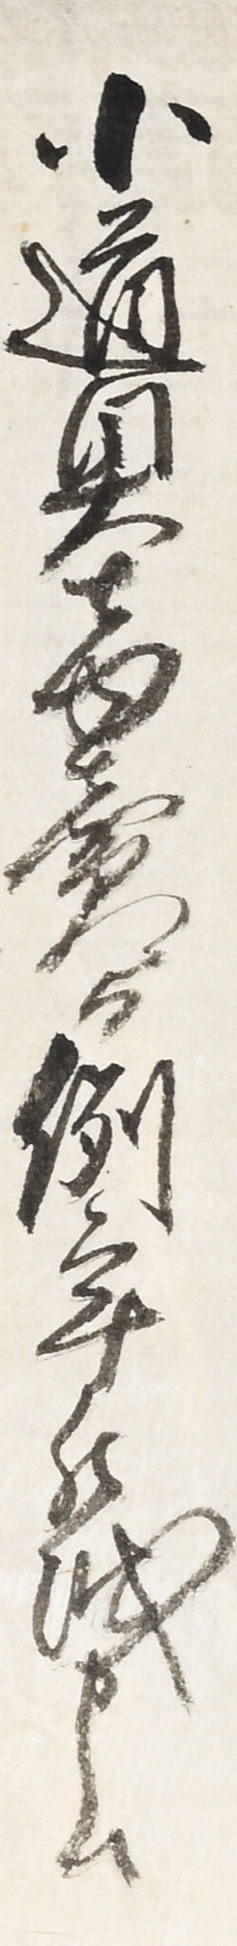小道具商売ニ而例年罷越申候
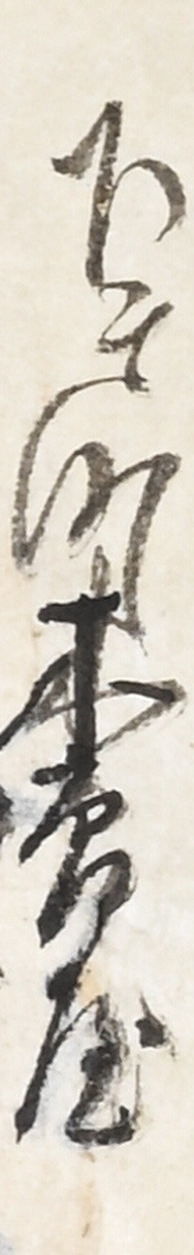下モ町木曽屋
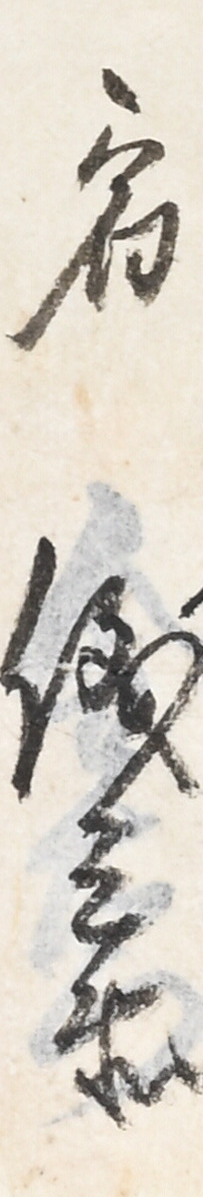宿儀兵衛
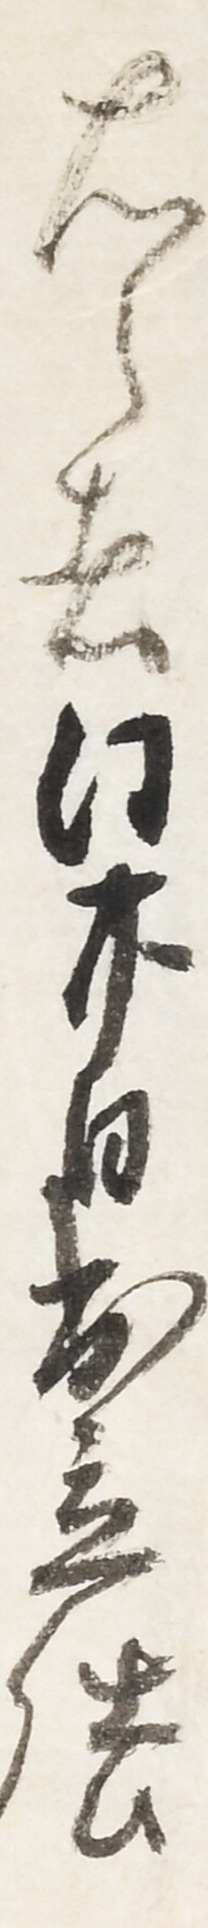右之者同廿日出立仕候
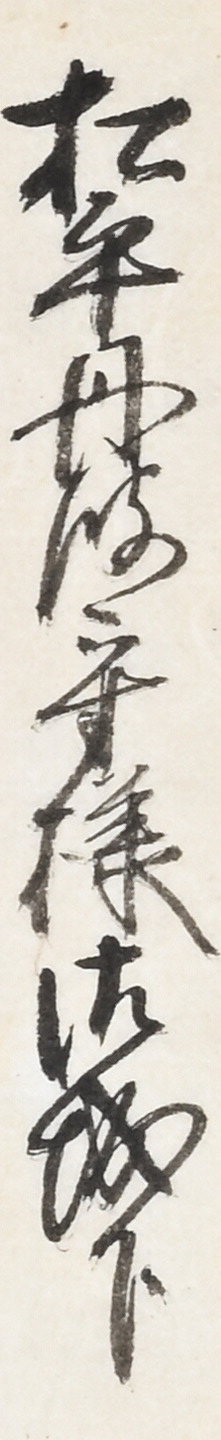松平丹波守様御城下
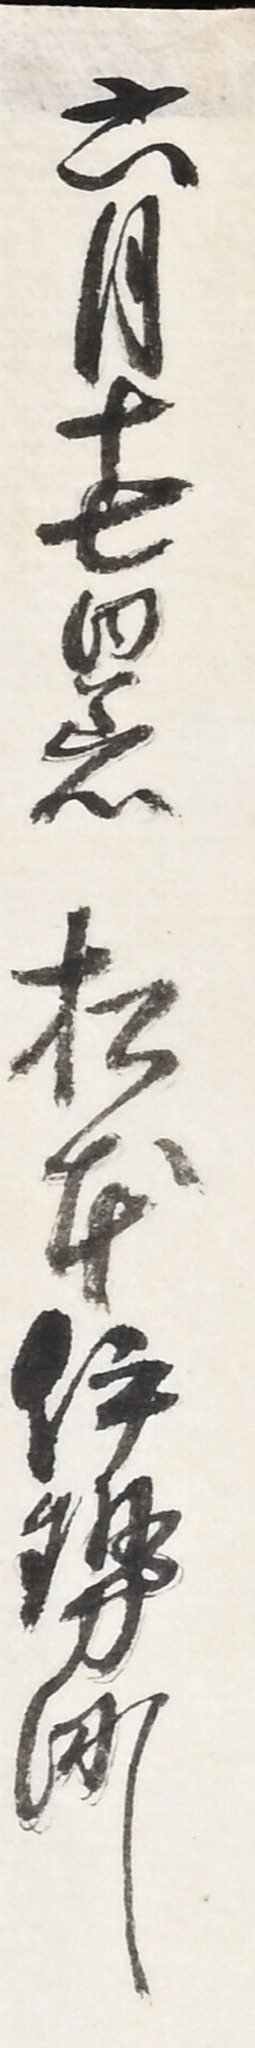六月十七日着松本伊勢町
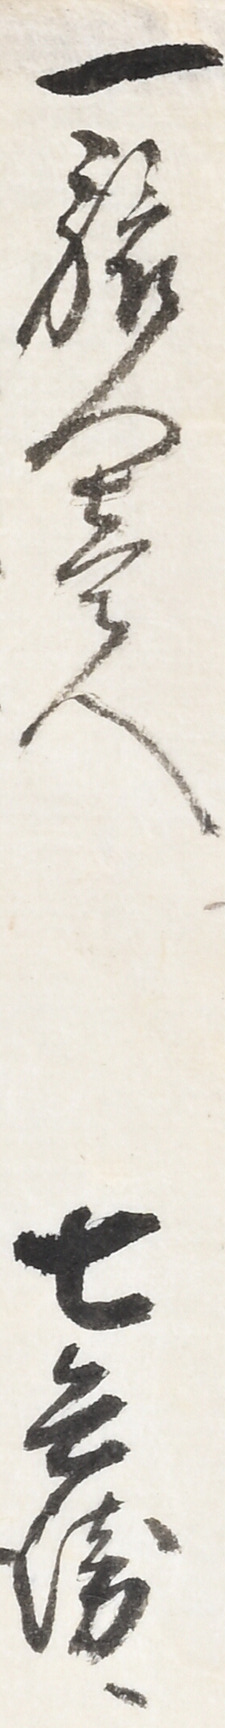一旅人壱人七兵衛・
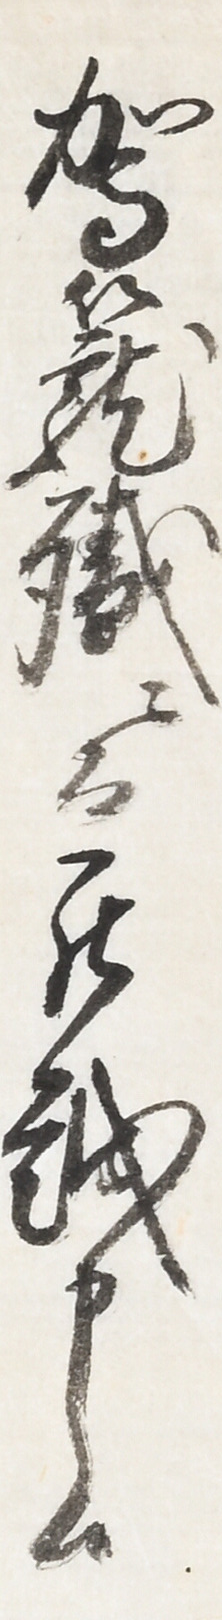駕籠職ニ而罷越申候
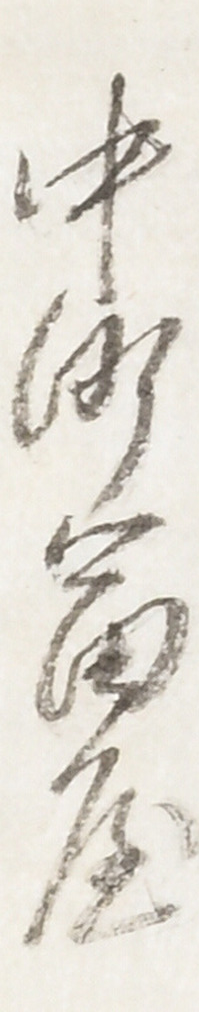中町冨屋
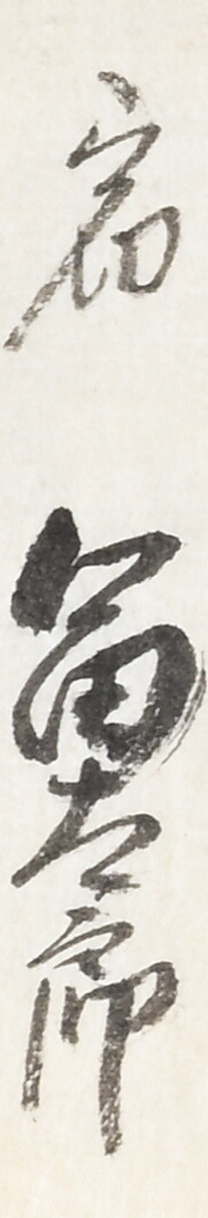宿冨太郎
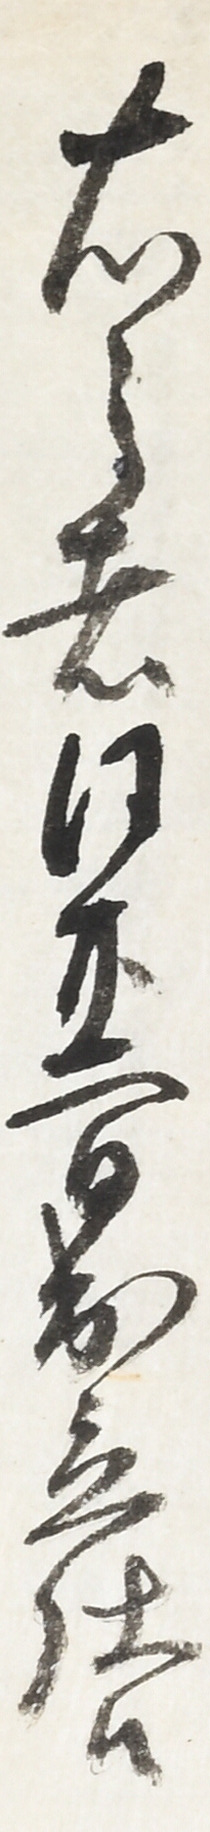右之者同廿二日出立仕候
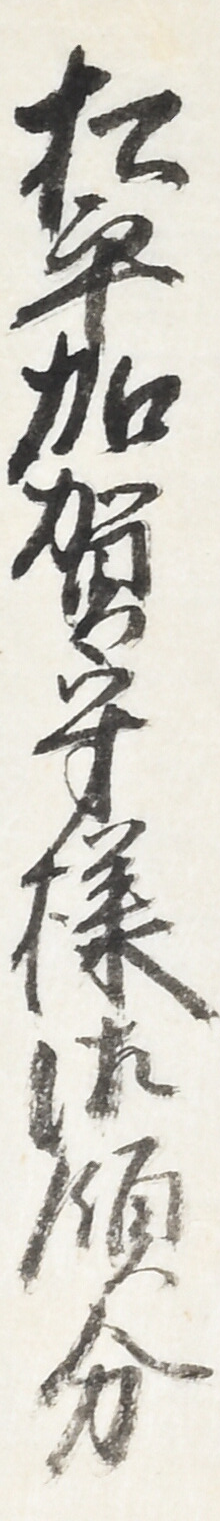松平加賀守様御領分
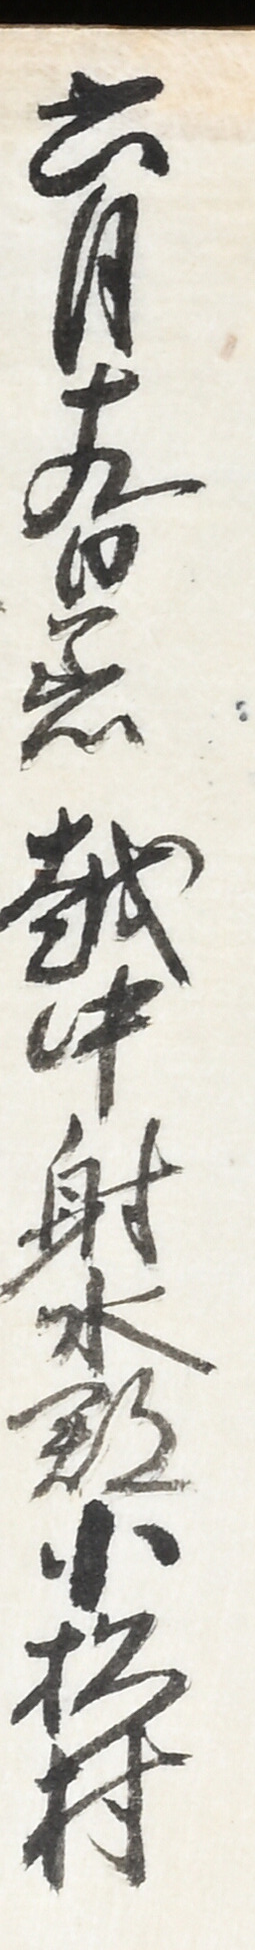六月十九日着越中射水郡小杉村
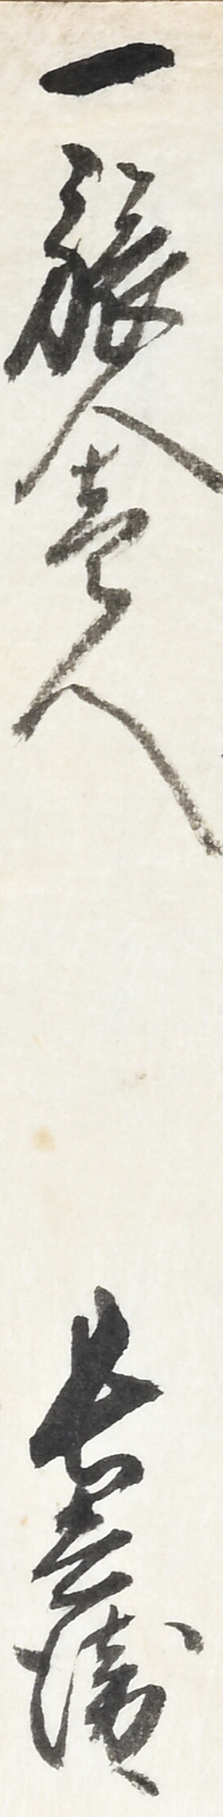一旅人壱人長兵衛・
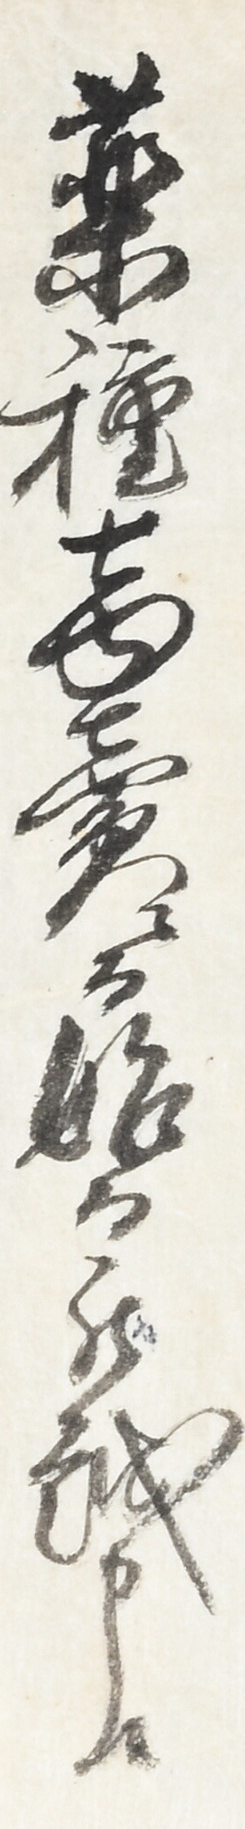薬種商売ニ而始而罷越申候

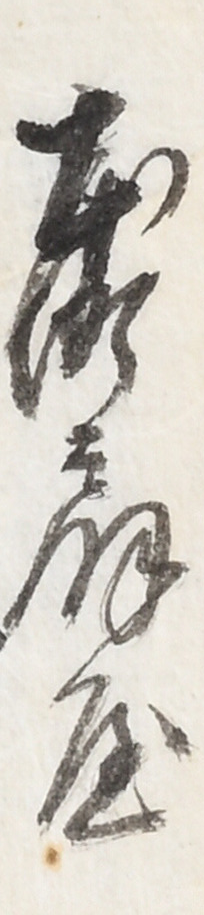本町扇屋
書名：旅人泊控帳
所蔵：伊那市立高遠町図書館・合同会社AMANE
